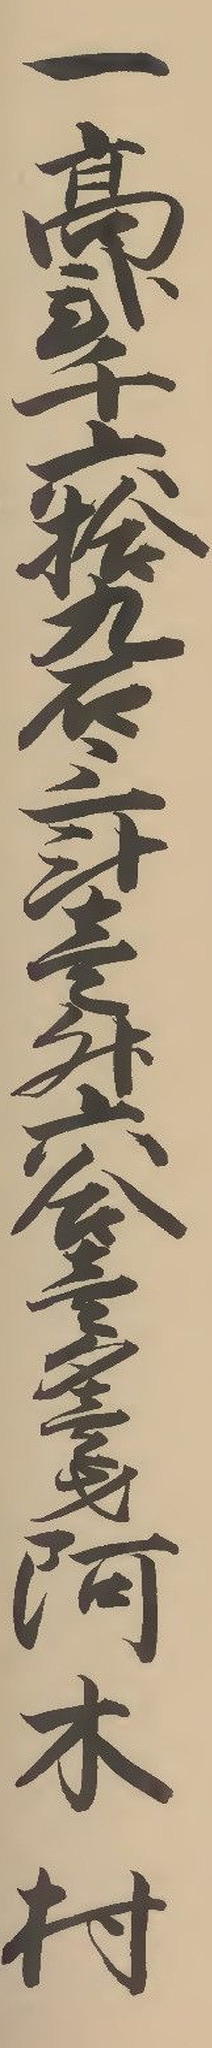一高弐千六拾九石三斗壱升六合壱勺壱才阿木村
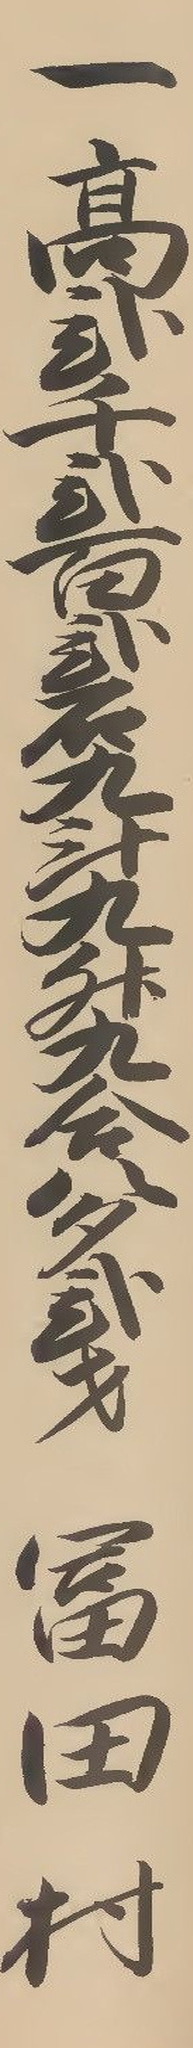一高弐千弐百弐石九斗九升九合八勺弐才富田村
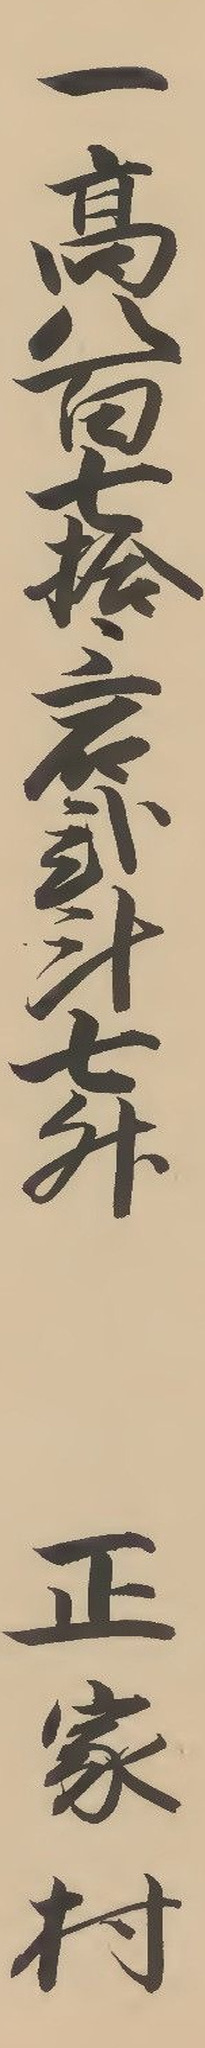一高八百七拾三石弐斗七升正家村
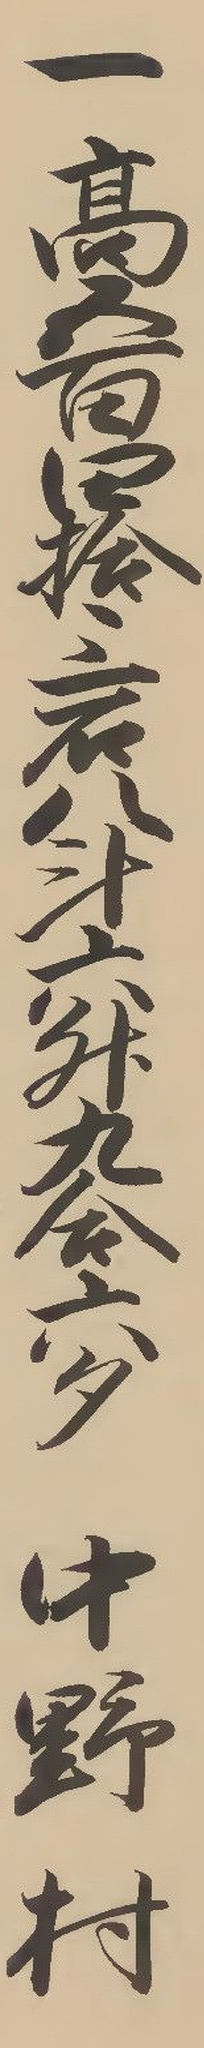一高五百四拾三石八斗六升九合六勺中野村
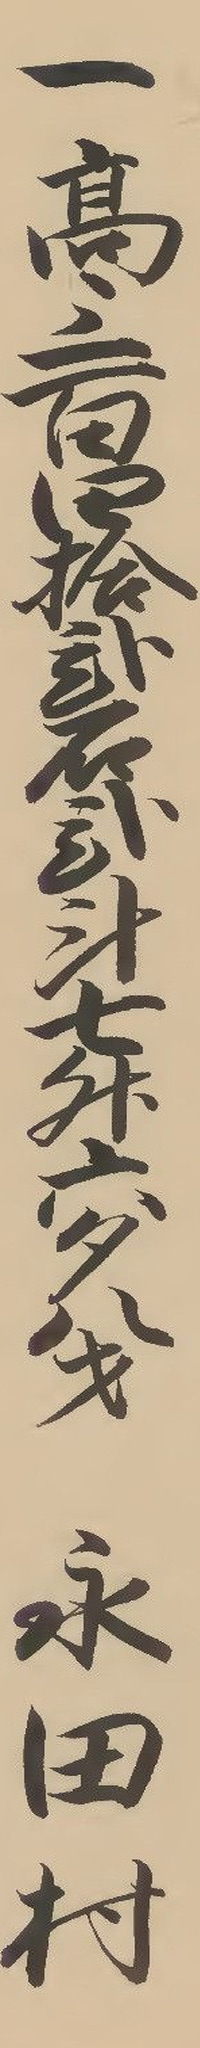一高三百四拾弐石弐斗七升六勺八才永田村

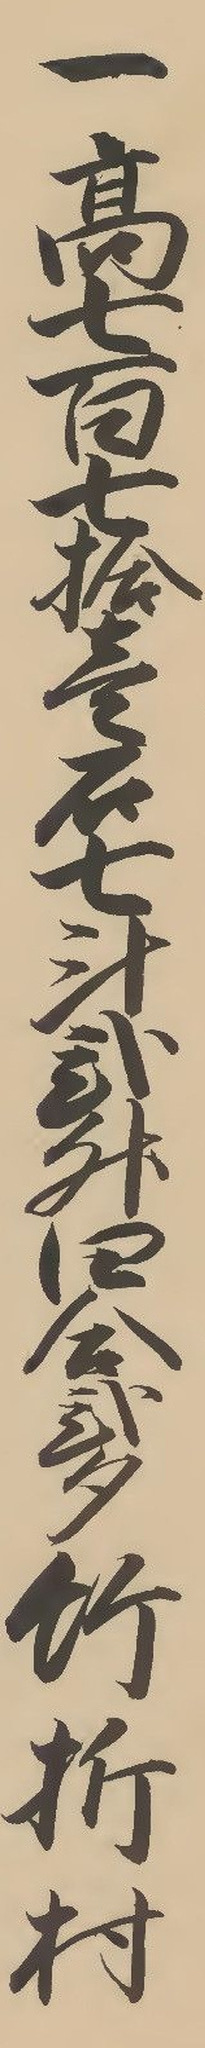一高七百七拾壱石七斗弐升四合弐勺竹折村
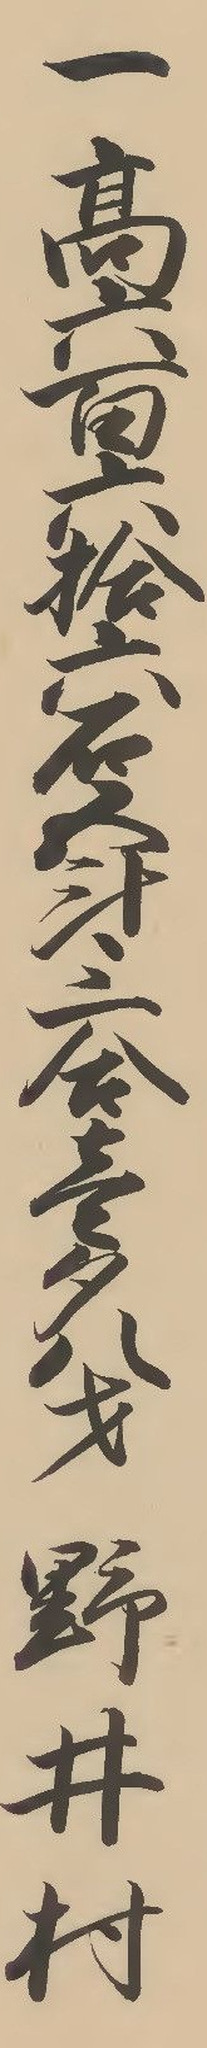一高六百六拾六石五斗三合壱勺八才野井村
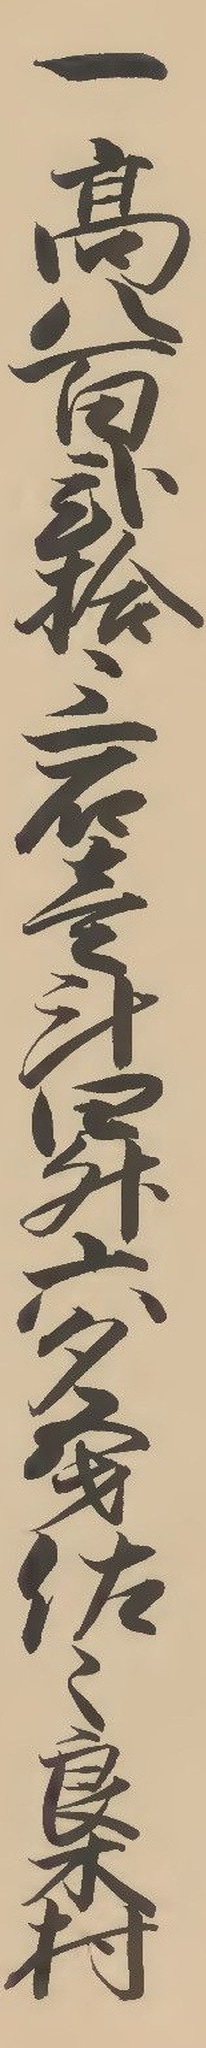一高八百弐拾三石壱斗四升六勺五才佐々良木村
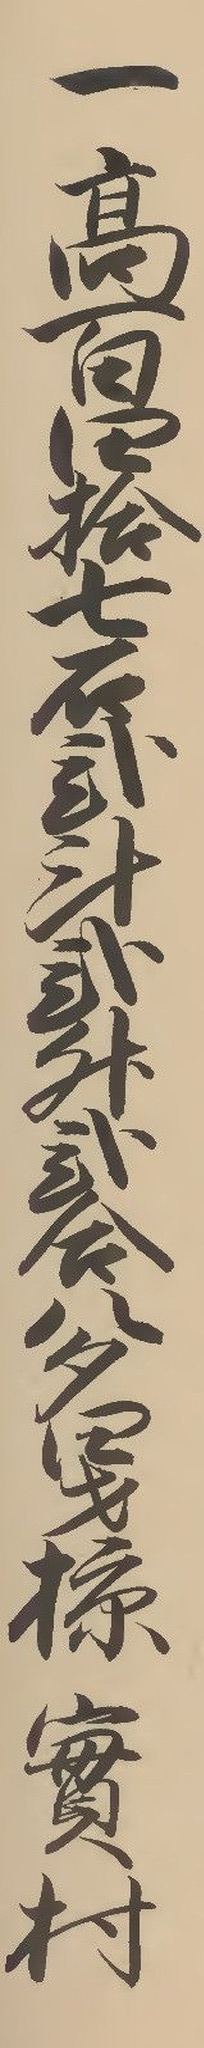一高百四拾七石弐斗弐升弐合八勺四才椋実村
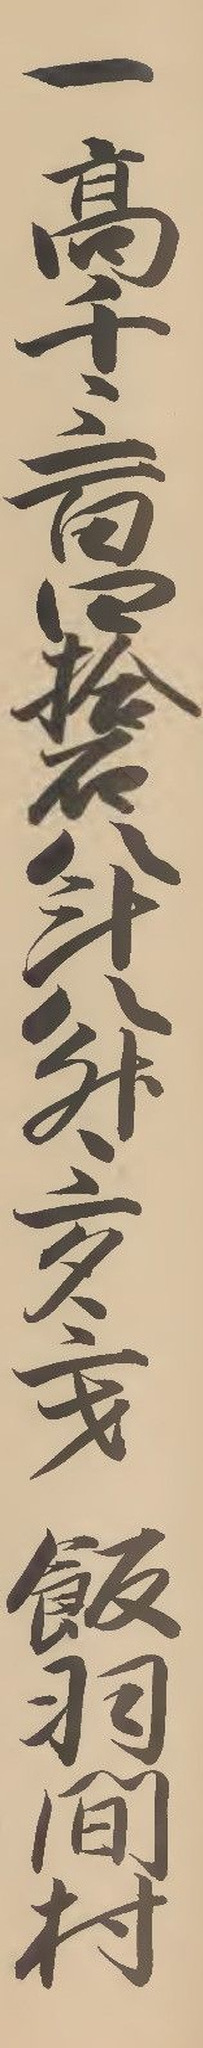一高千三百四拾石八斗八升三勺三才飯羽間村
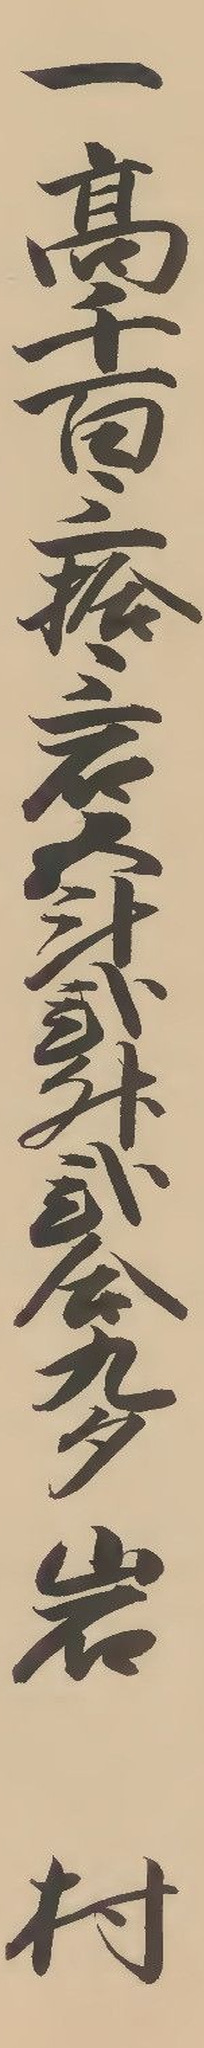一高千百三拾三石五斗弐升弐合九勺岩村
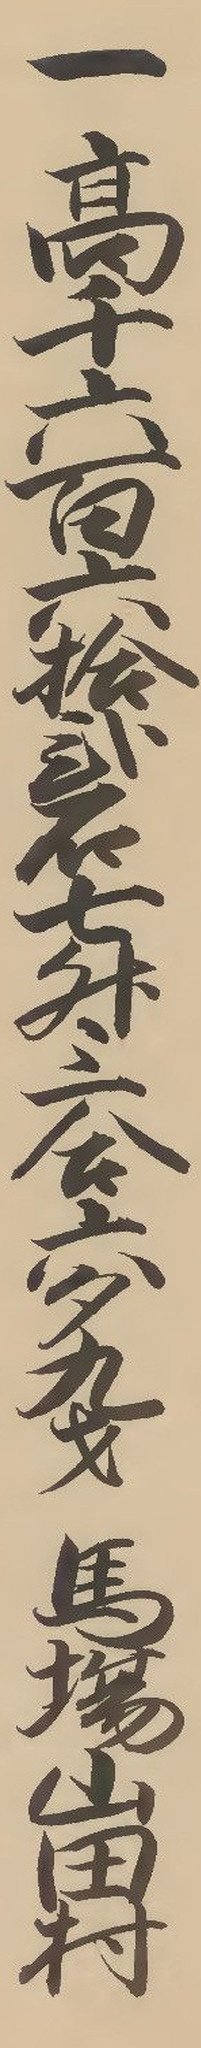一高千六百六拾弐石七升三合六勺九才馬場山田村
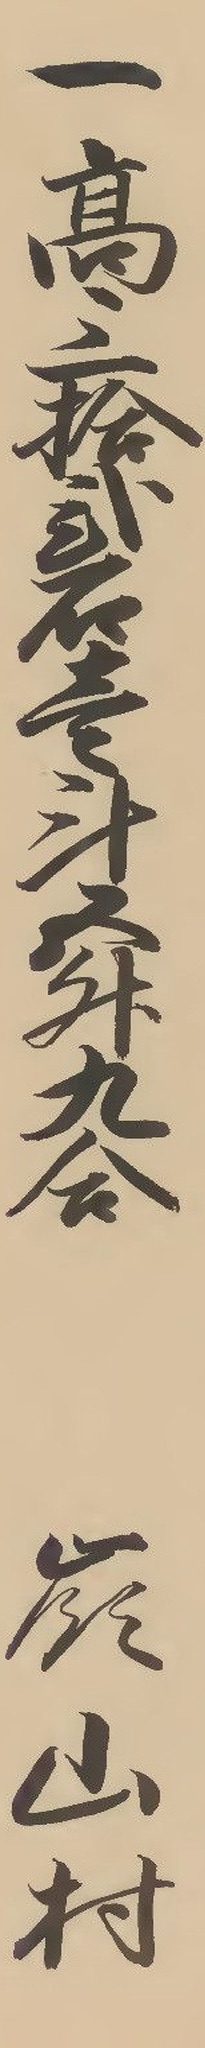一高三拾弐石壱斗五升九合嶺山村

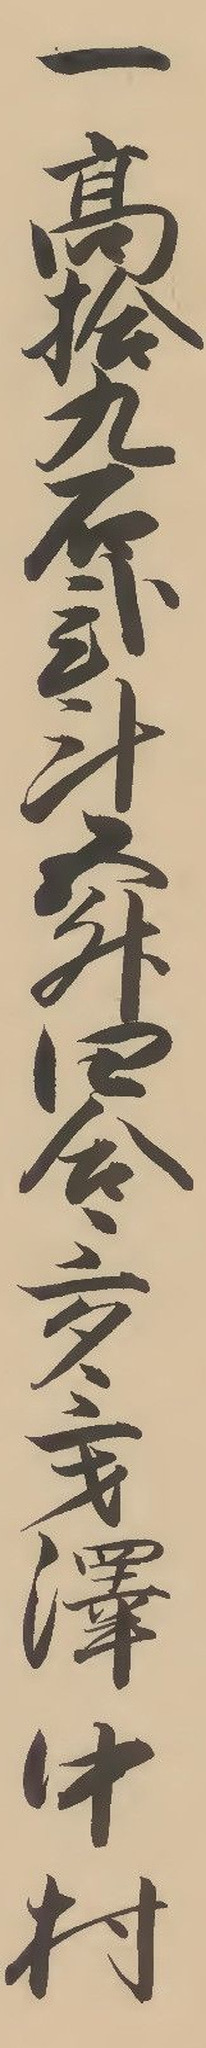一高拾九石弐斗五升四合三勺三才沢中村
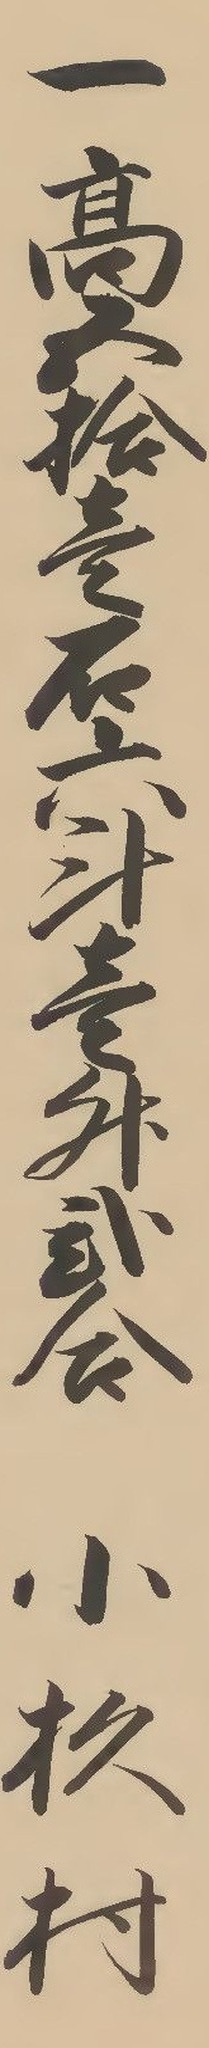一高五拾壱石六斗壱升弐合小杉村
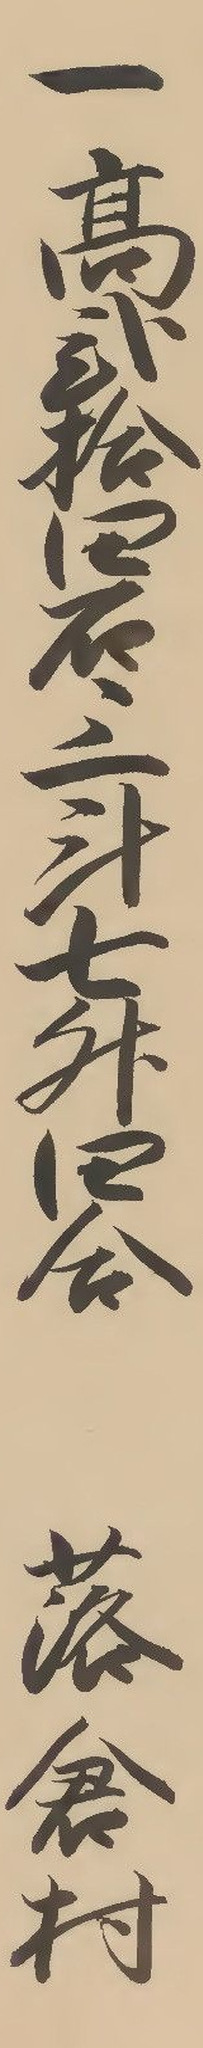一高弐拾四石三斗七升四合落倉村
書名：美濃国郷帳
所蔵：国立公文書館 National Archives of Japan
